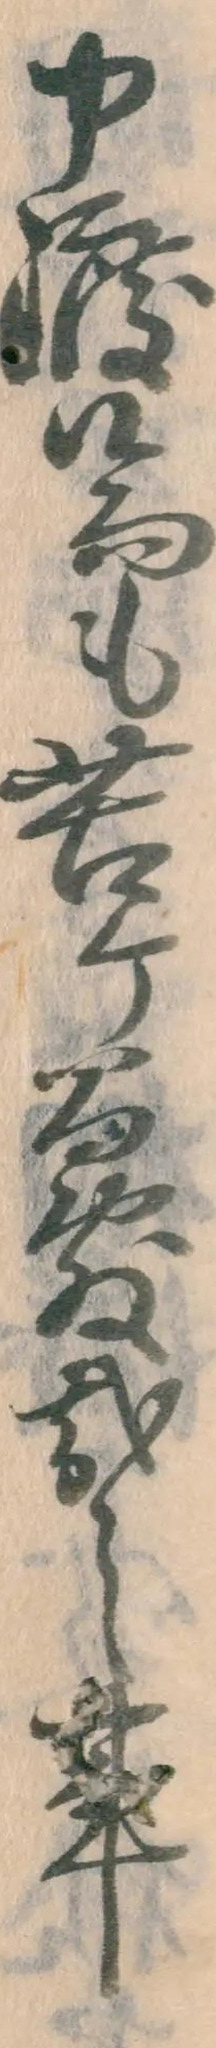申渡候而も苦ケ間敷哉之事
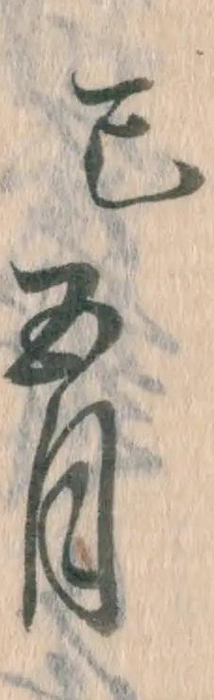巳五月
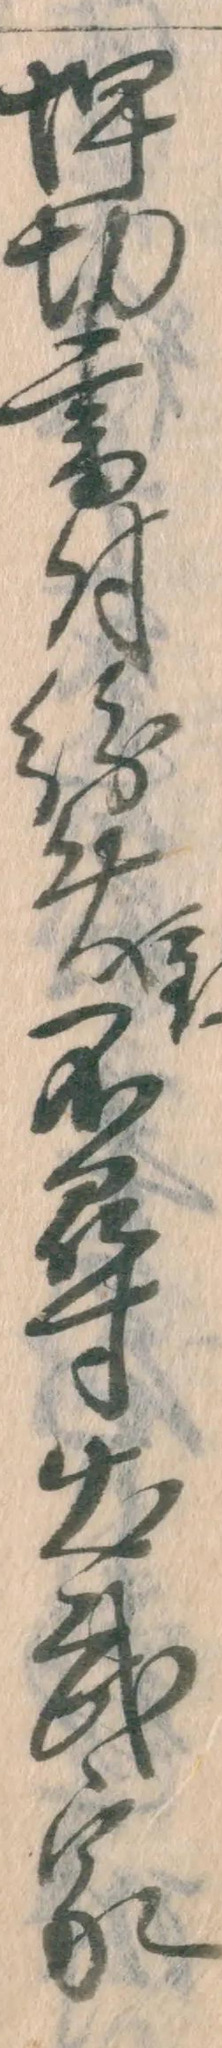押切書付紛失致し不尋出武家
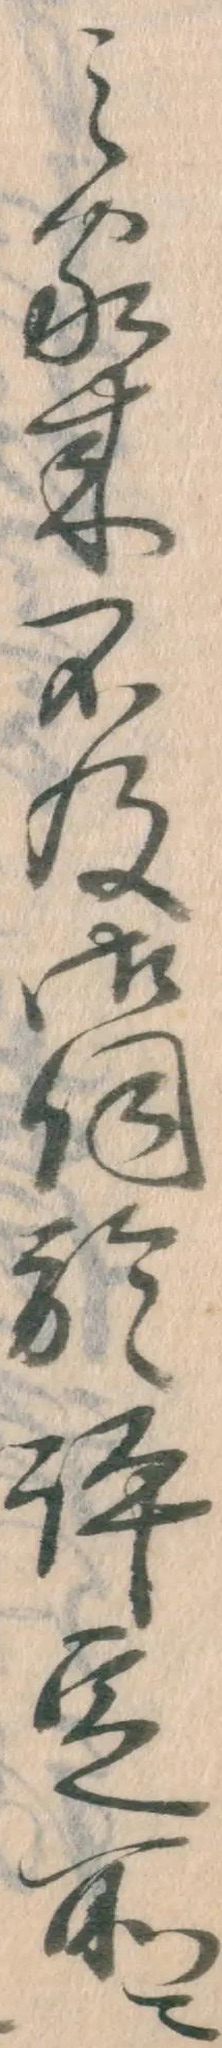之家来不及御伺於評定所ニ
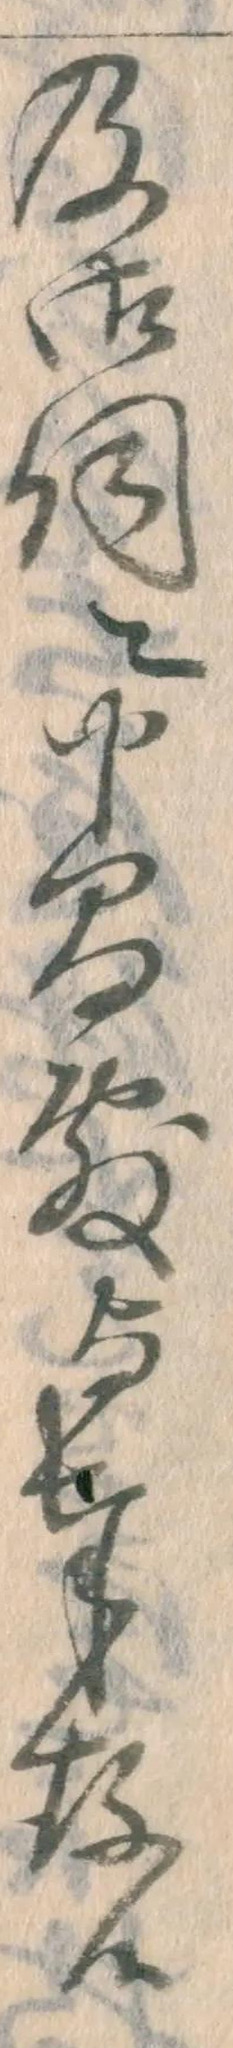及御伺ニ申間敷と奉存候
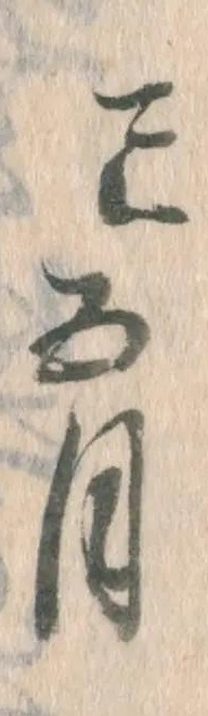巳五月

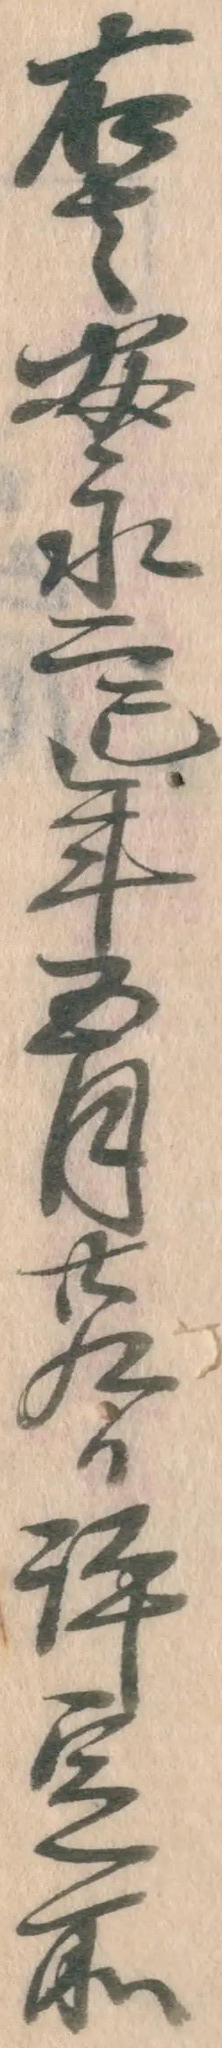右は安永二巳年五月廿九日評定所
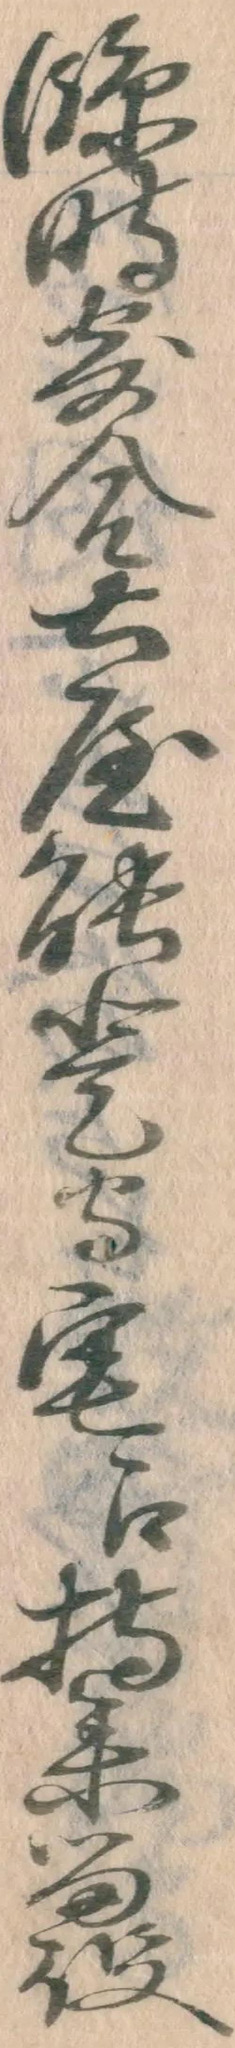臨時寄合土屋能登守宅え持参留役
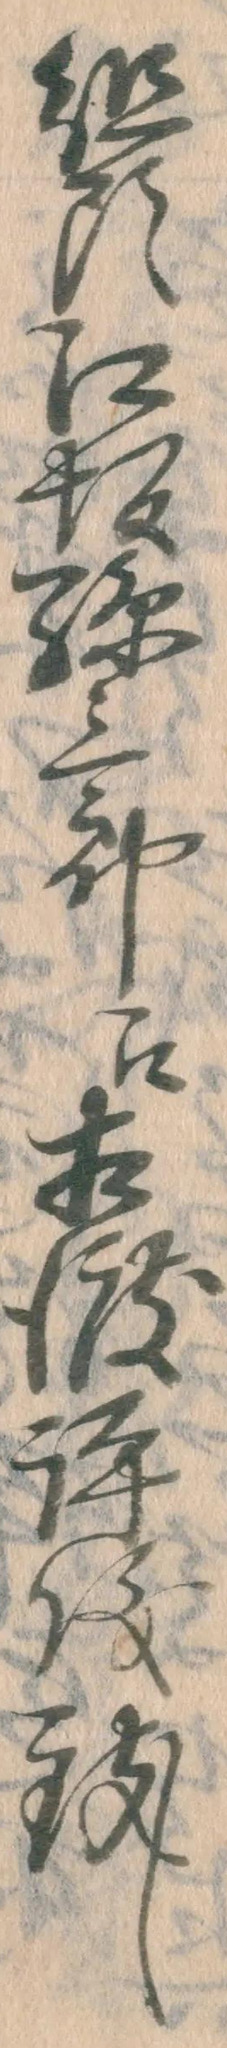組頭江坂孫三郎え相渡評儀致し
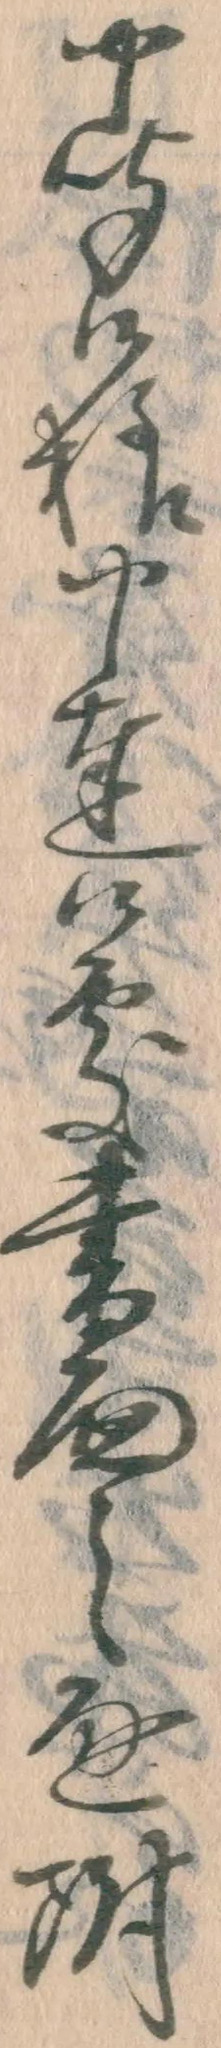申聞候様申達候処書面之通附
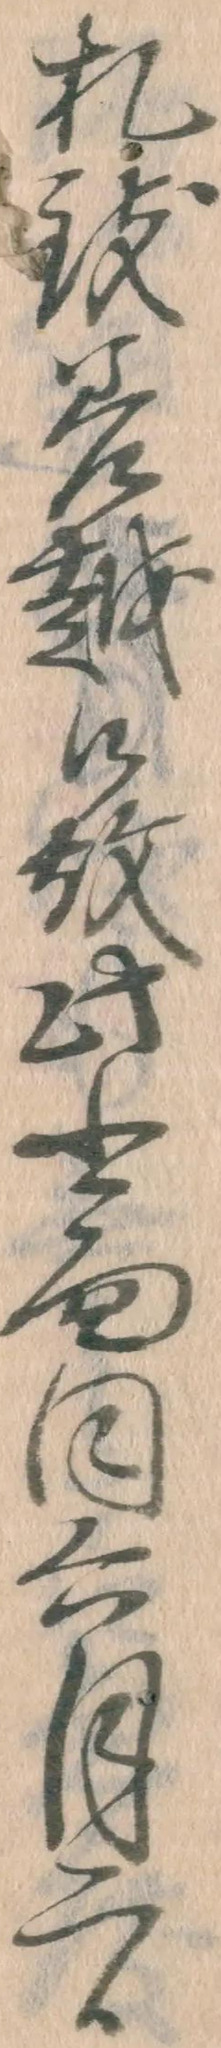札致差越候故此書面同六月二日
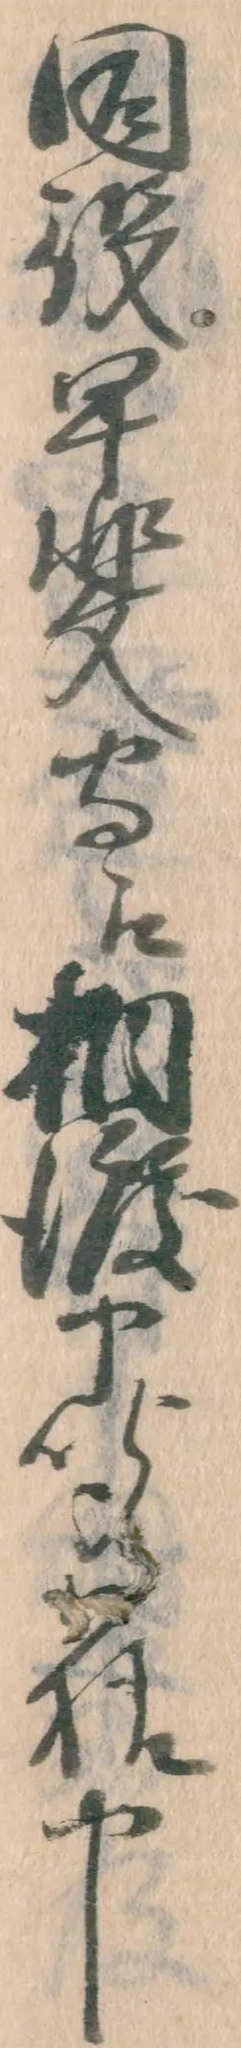同役甲斐守え相渡申聞候様申
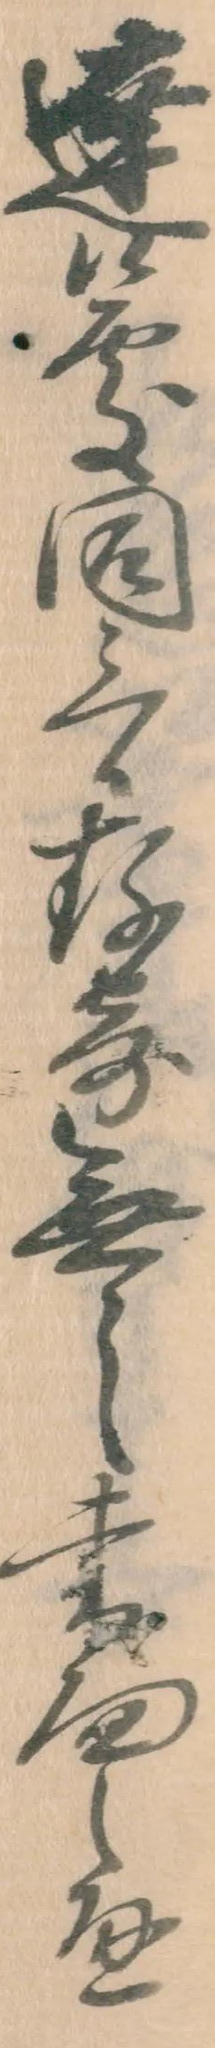達候処同三日存寄無之書面之通
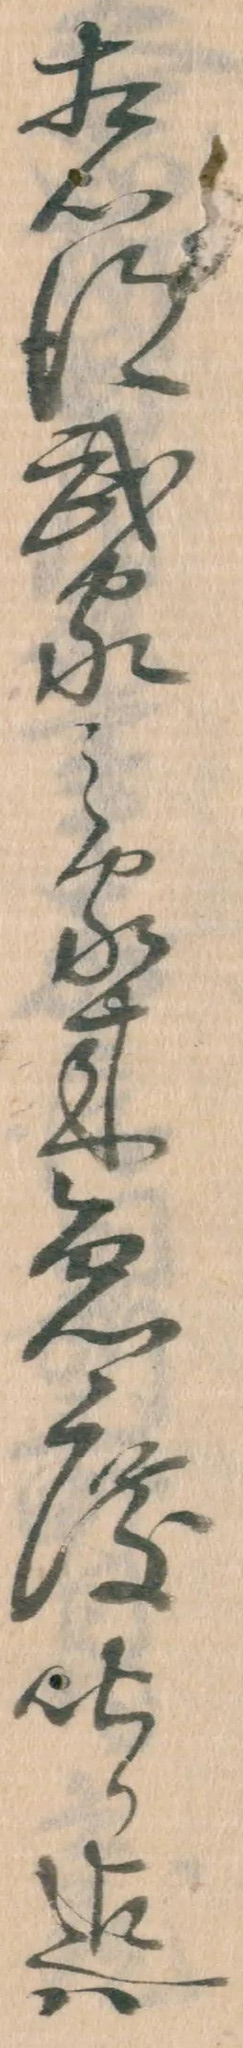相心得武家之家来急度叱り迄ハ
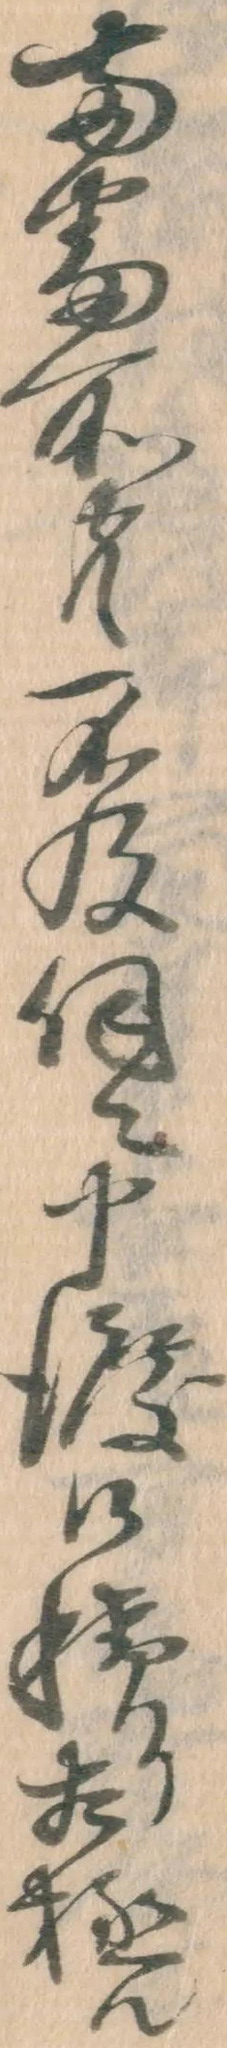両番所共不及伺ニ申渡候積り相極ル

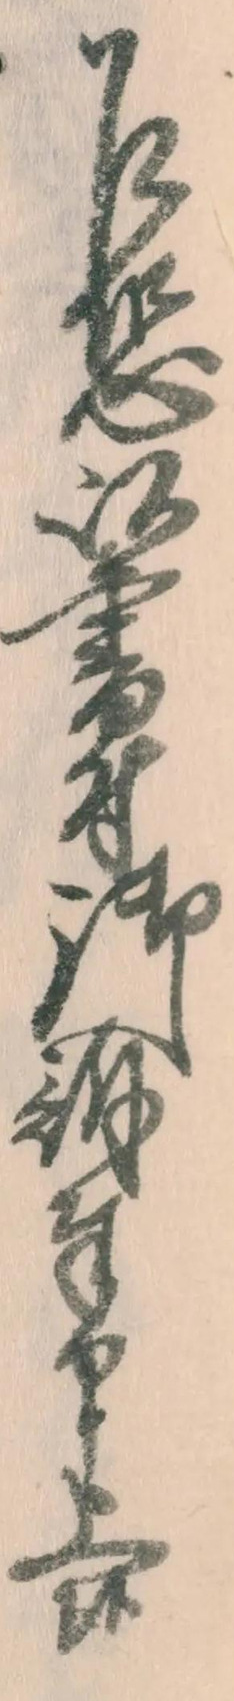乍恐以書付御訴奉申上候
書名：武家方并寺院等ニテ施差出候一件
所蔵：国立国会図書館 National Diet Library, JAPAN
